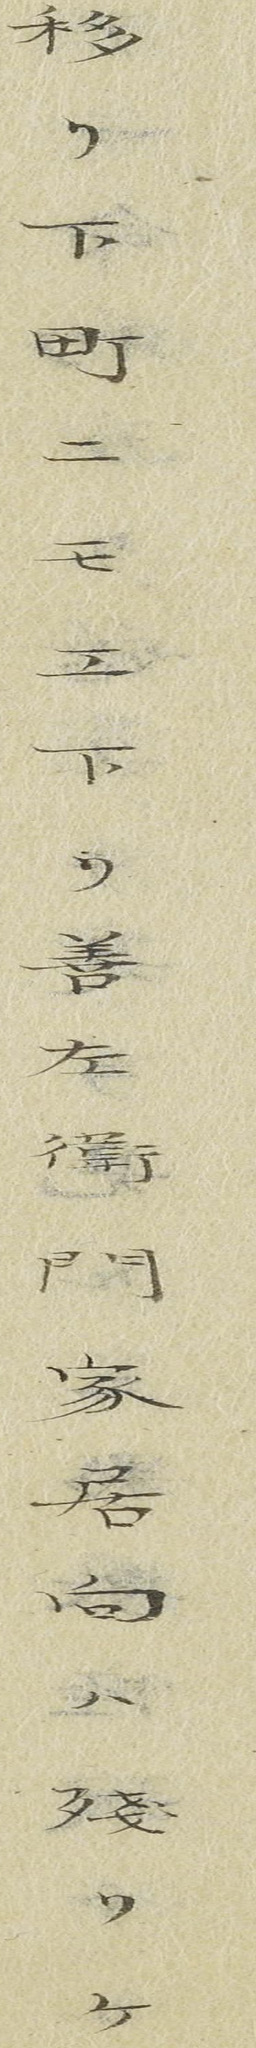移リ下町ニモエ下リ善左衛門家居向ハ残リケ
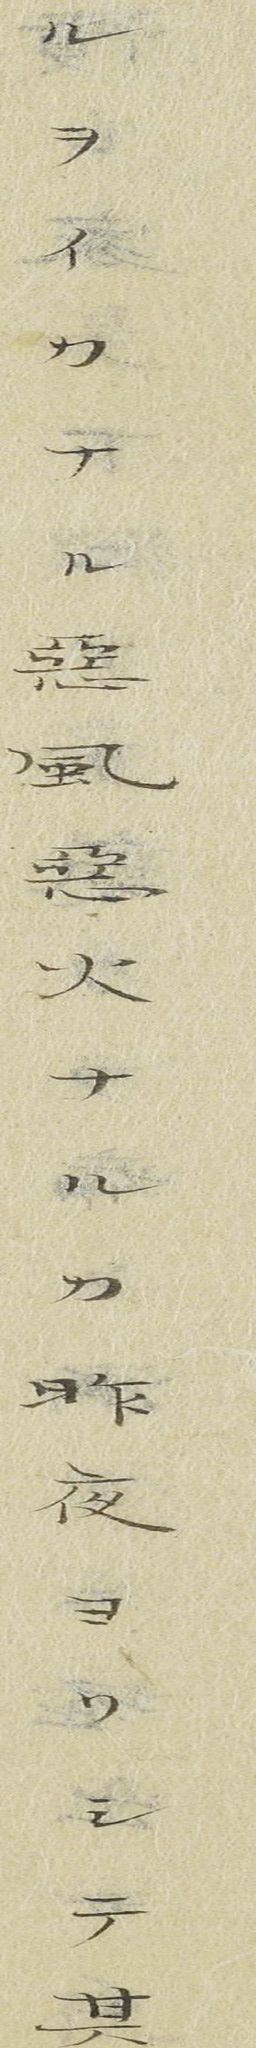ルヲイカナル悪風悪火ナルカ昨夜ヨリシテ其
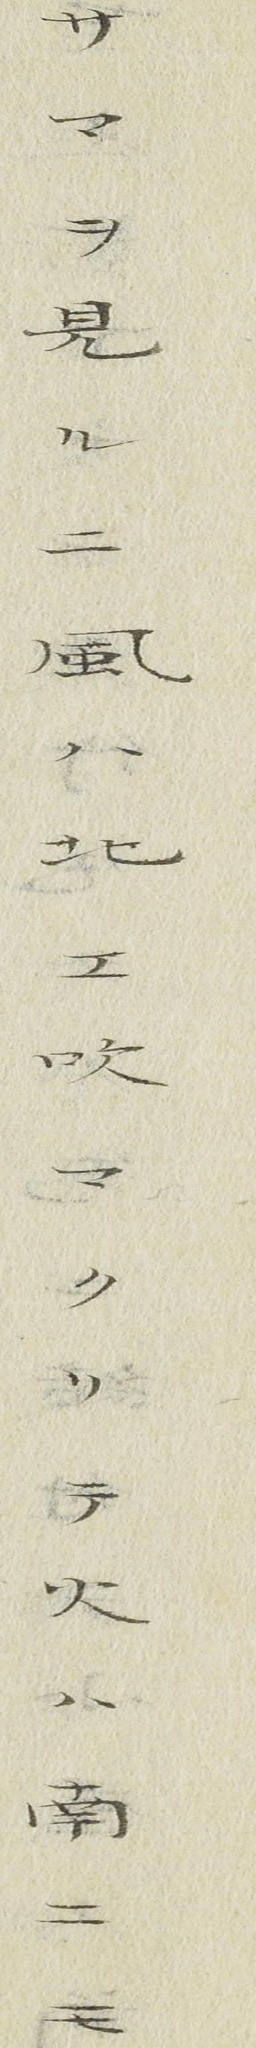サマヲ見ルニ風ハ北エ吹マクリテ火ハ南ニモ
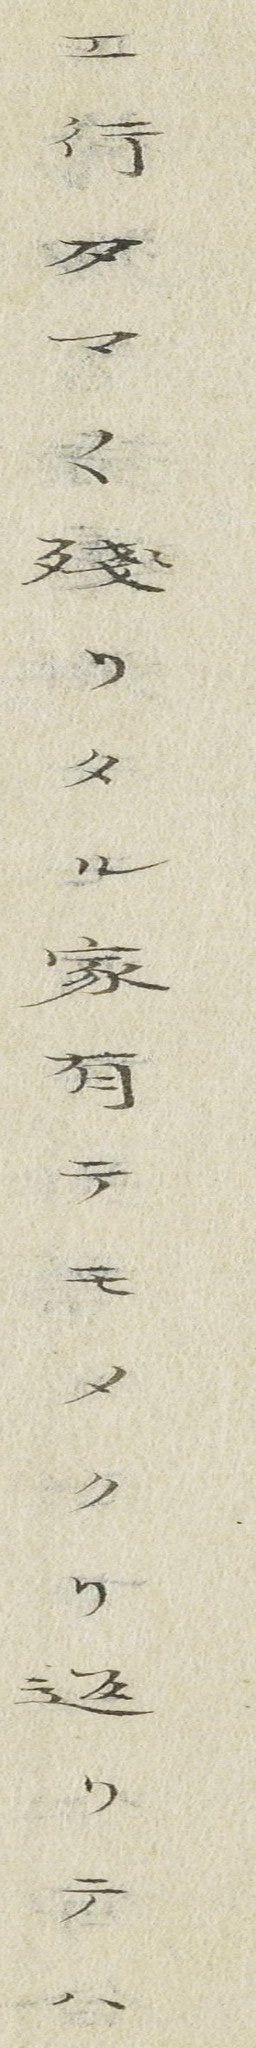エ行タマ〱残リタル家有テモメクリ返リテハ
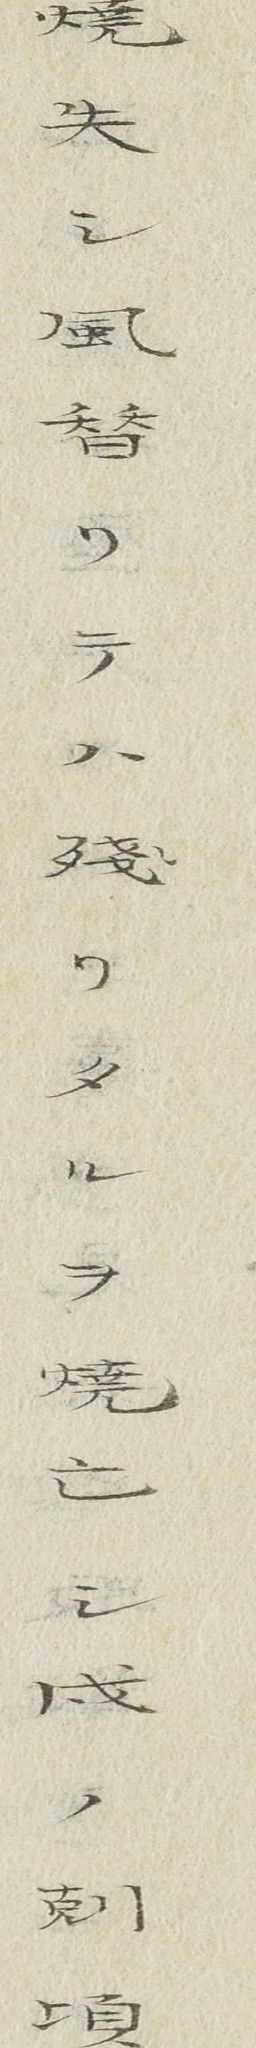焼失シ風替リテハ残リタルヲ焼亡シ戌ノ剋頃
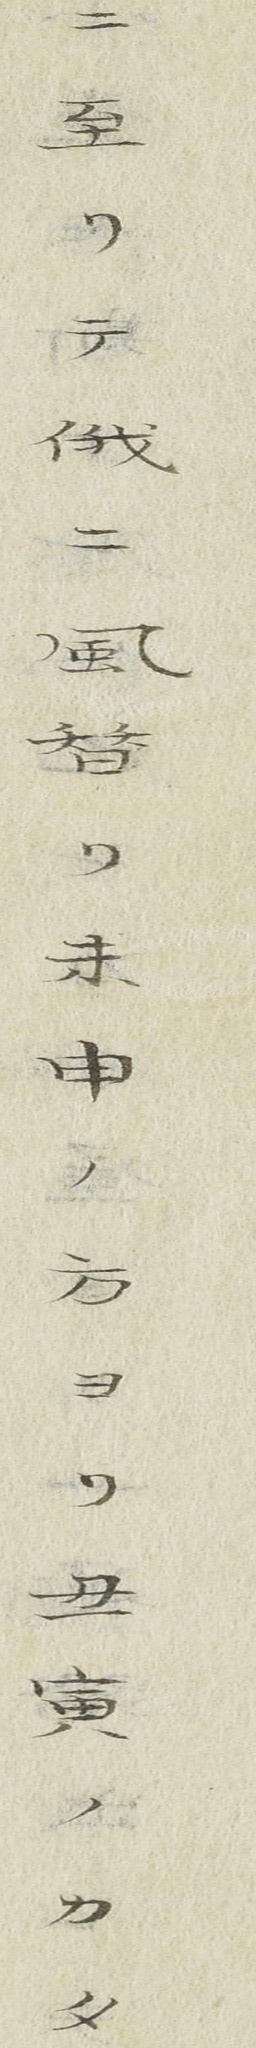ニ至リテ俄ニ風替リ未申ノ方ヨリ丑寅ノカタ
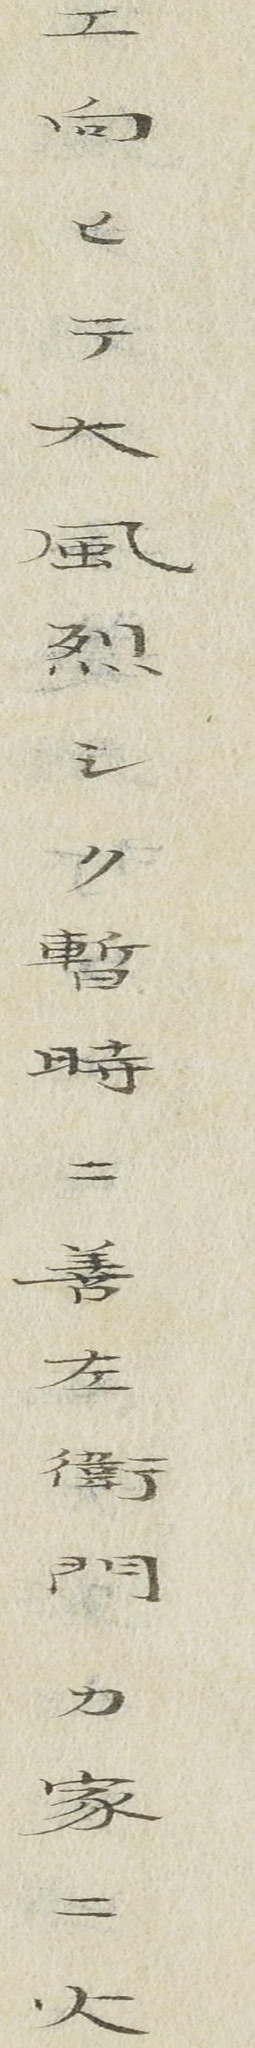エ向ヒテ大風烈シク暫時ニ善左衛門カ家ニ火
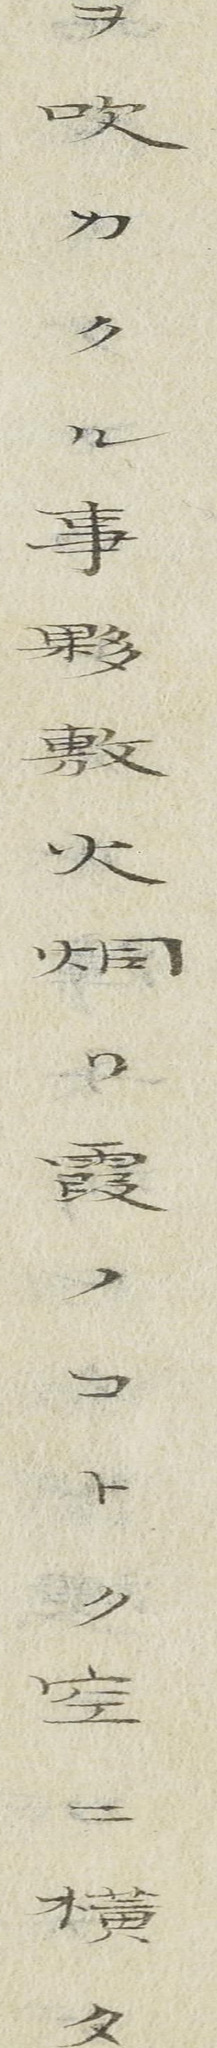ヲ吹カクル事夥敷火烟リ霞ノコトク空ニ横タ
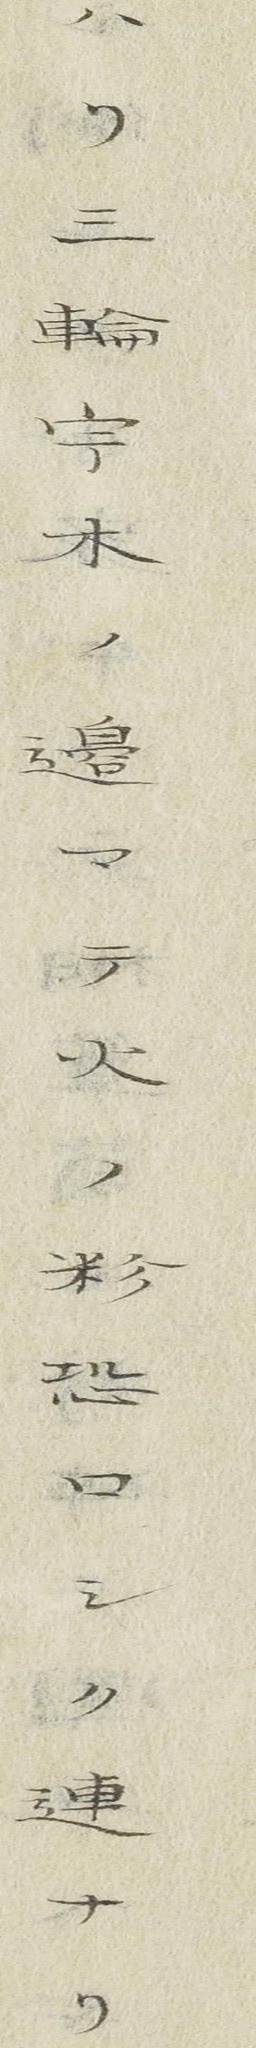ハリ三輪宇木ノ辺マテ火ノ粉恐ロシク連ナリ
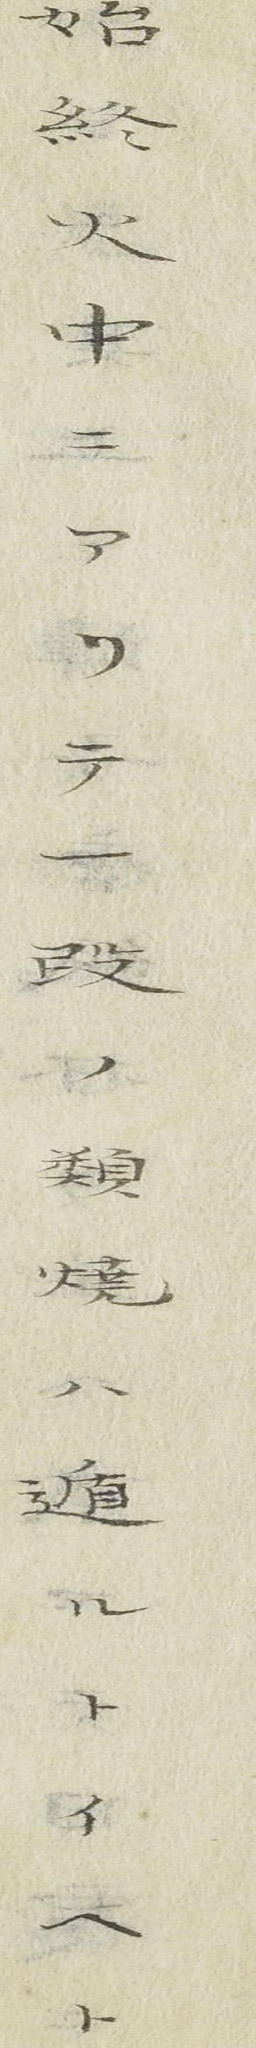始終火中ニアリテ一段ノ類焼ハ遁ルトイヘト
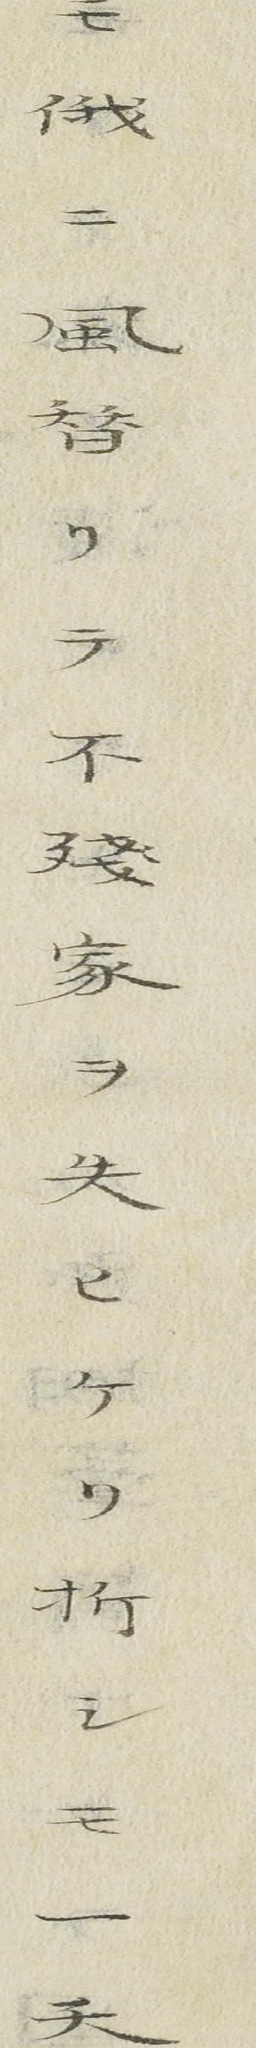モ俄ニ風替リテ不残家ヲ失ヒケリ折シモ一天
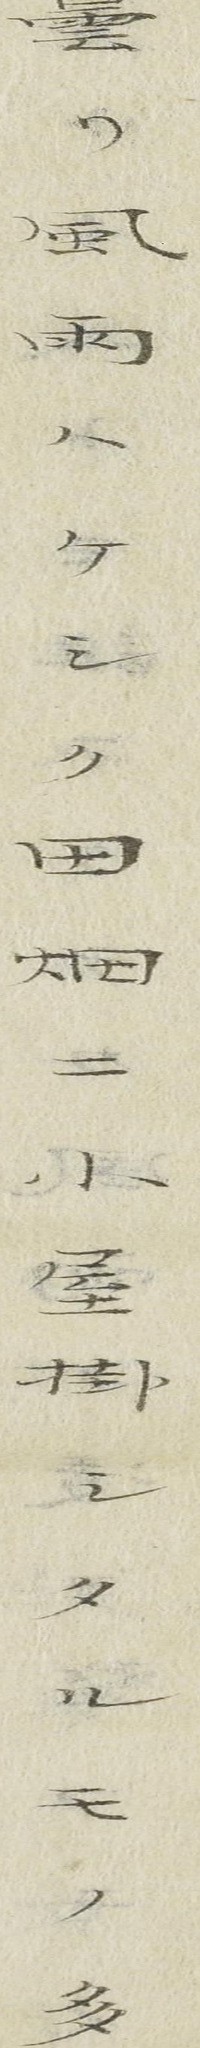曇リ風雨ハケシク田畑ニ小屋掛シタルモノ多

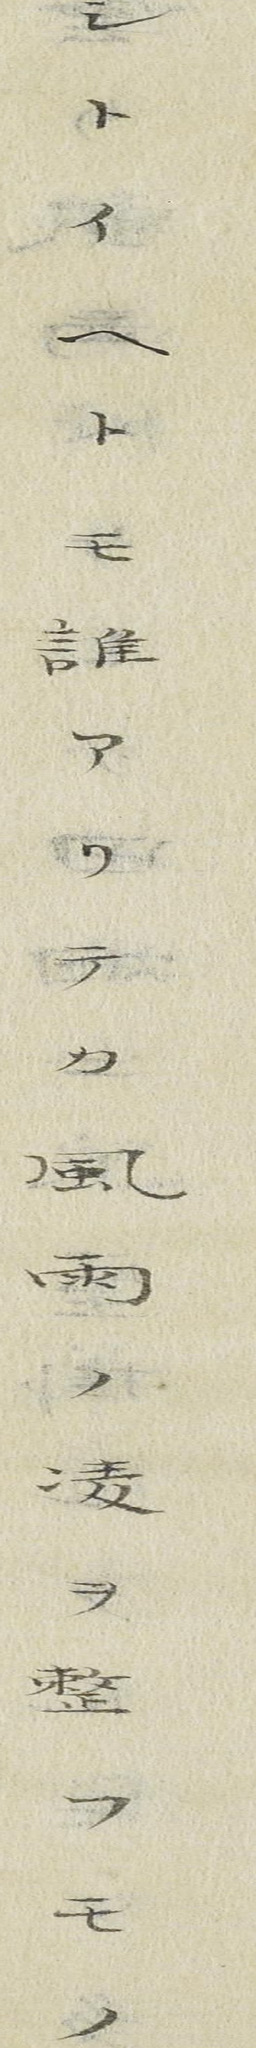シトイヘトモ誰アリテカ風雨ノ凌ヲ整フモノ
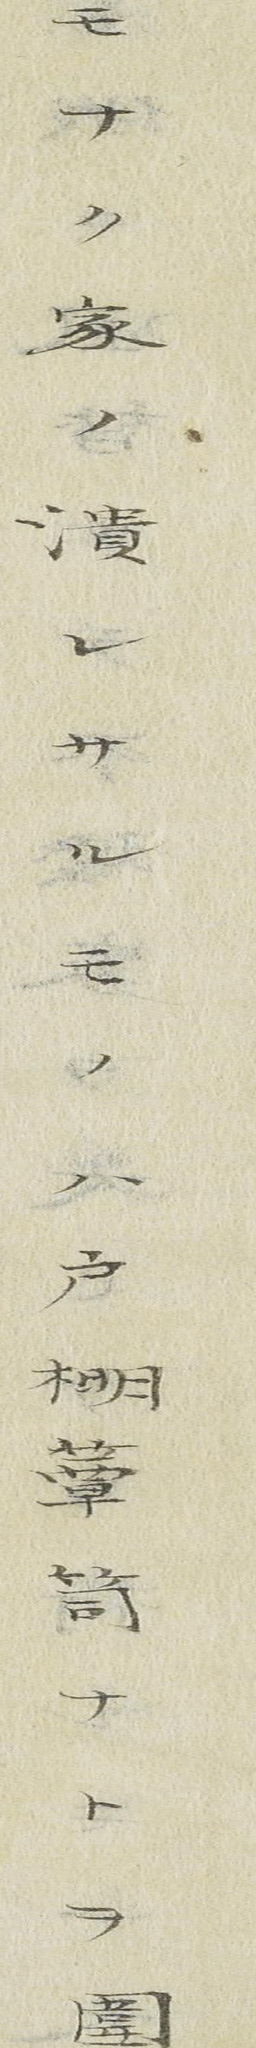モナク家ノ潰レサルモノハ戸棚箪笥ナトヲ囲
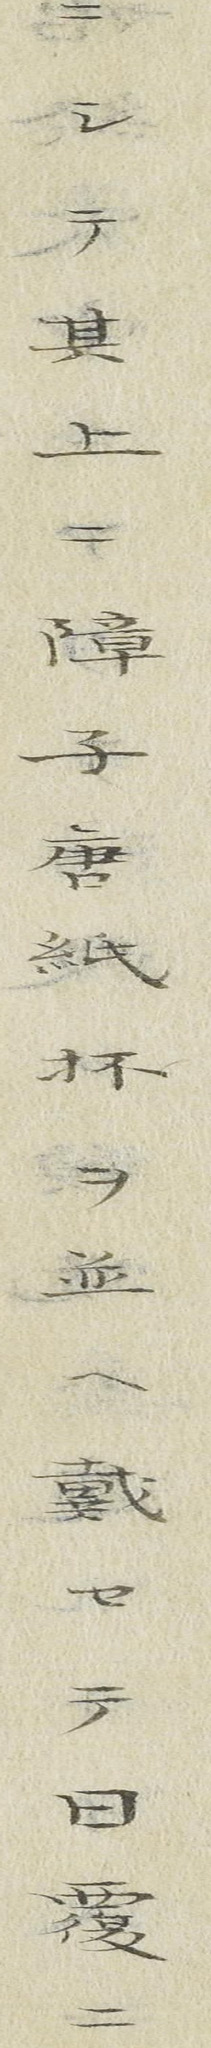ニシテ其上ニ障子唐紙抔ヲ並ヘ戴セテ日覆ニ
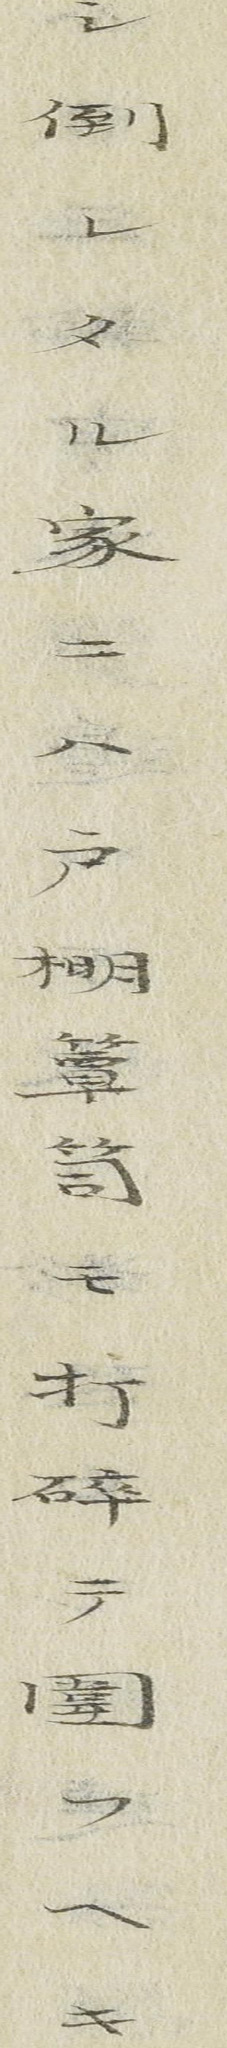シ倒レタル家ニハ戸棚箪笥モ打砕テ囲フヘキ
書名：地災撮要　地震之部　巻ノ二
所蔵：東京大学地震研究所図書室 Earthquake Research Institute Library, The University of Tokyo, JAPAN
